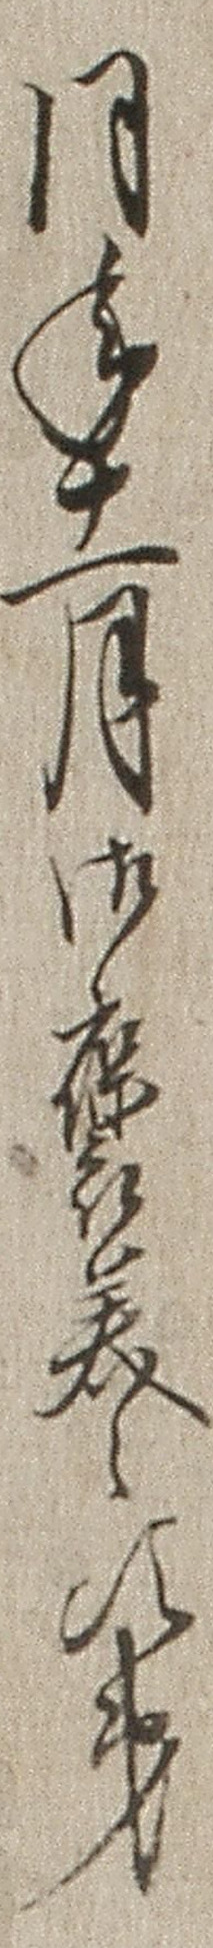同年十一月御褒美之次第
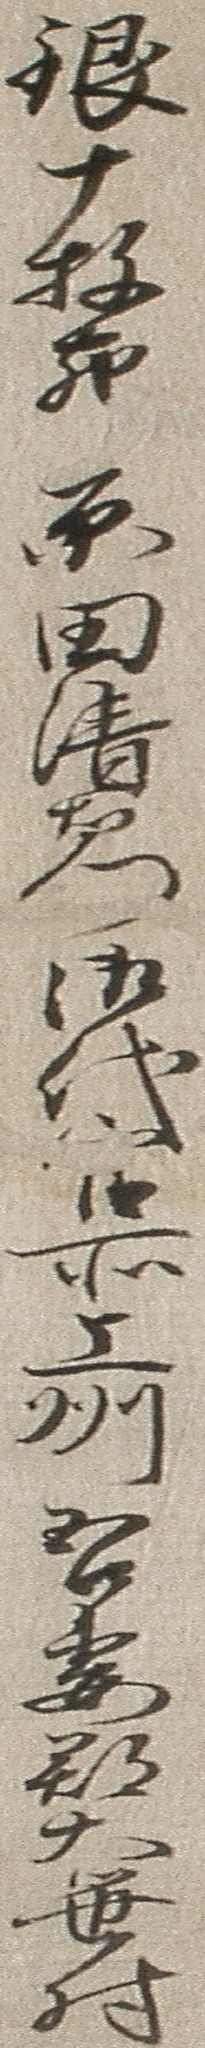銀十枚宛原田清右衛門御代官所上州吾妻郡大笹村
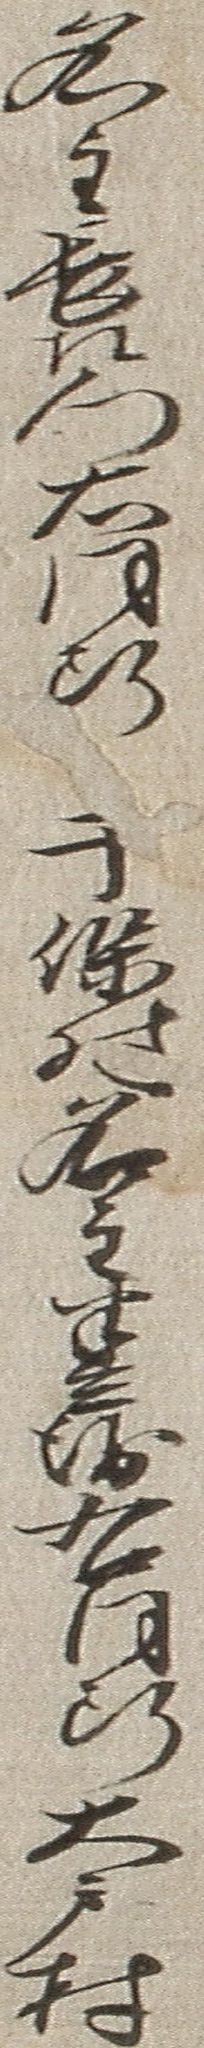名主長左衛門右同断干俣村名主半兵衛右同断大戸村
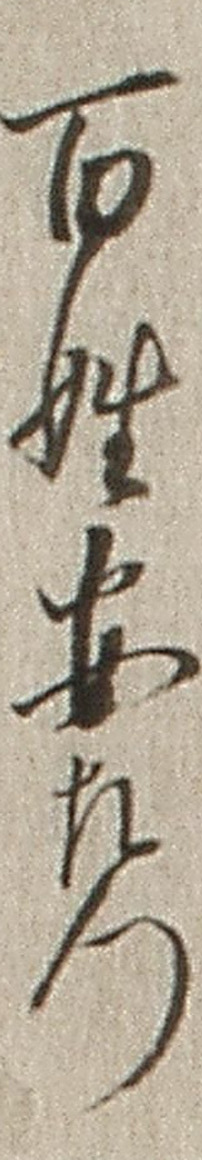百姓安左衛門
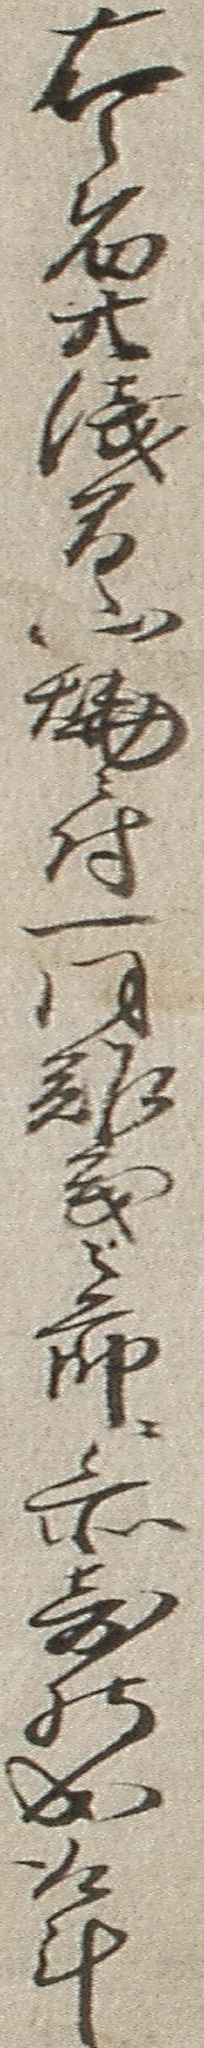右之者共浅間山焼に付一同難義之節に候所奇持成取斗
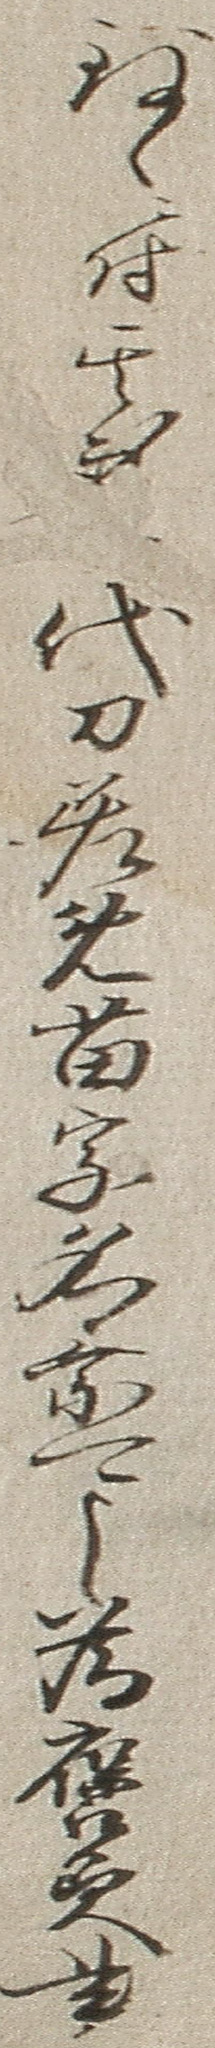致候に付其身一代刀差免苗字名乗可申候為褒美書
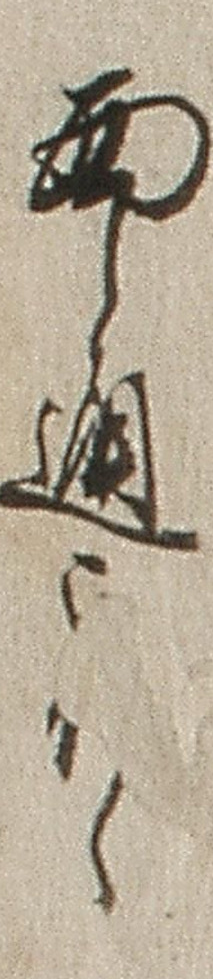面之通被下候
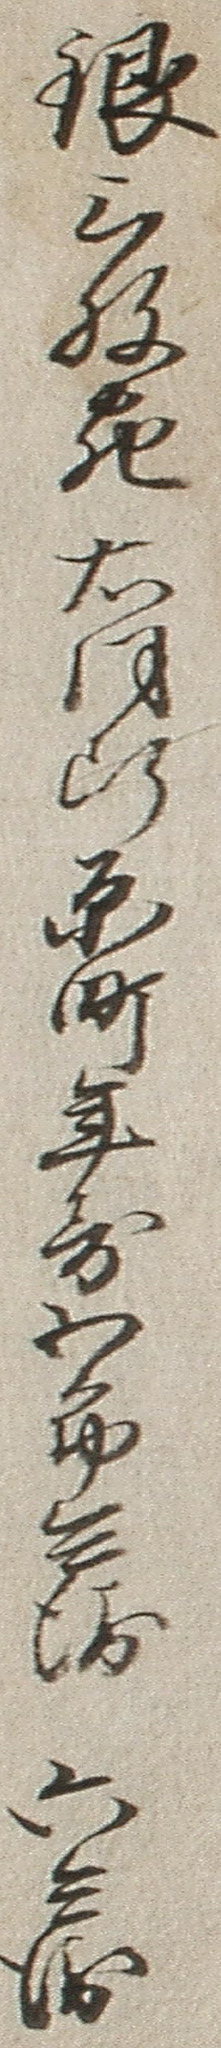銀三枚宛右同断原町年寄五郎兵衛六兵衛
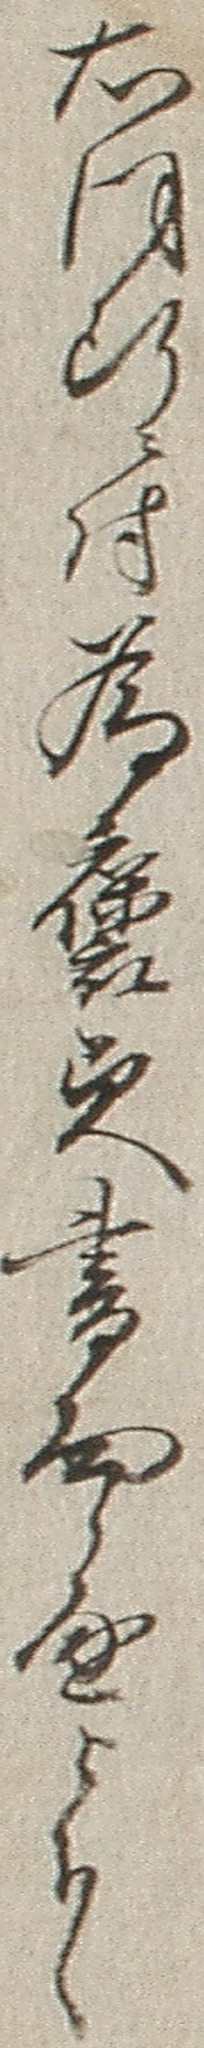右同断に付為褒美書面之通被下候

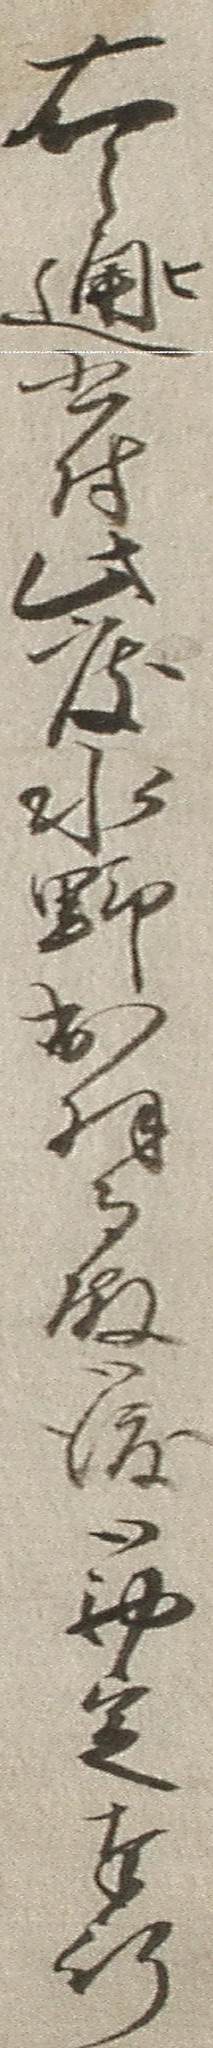右之通書付此度水野出羽守殿御渡御勘定奉行
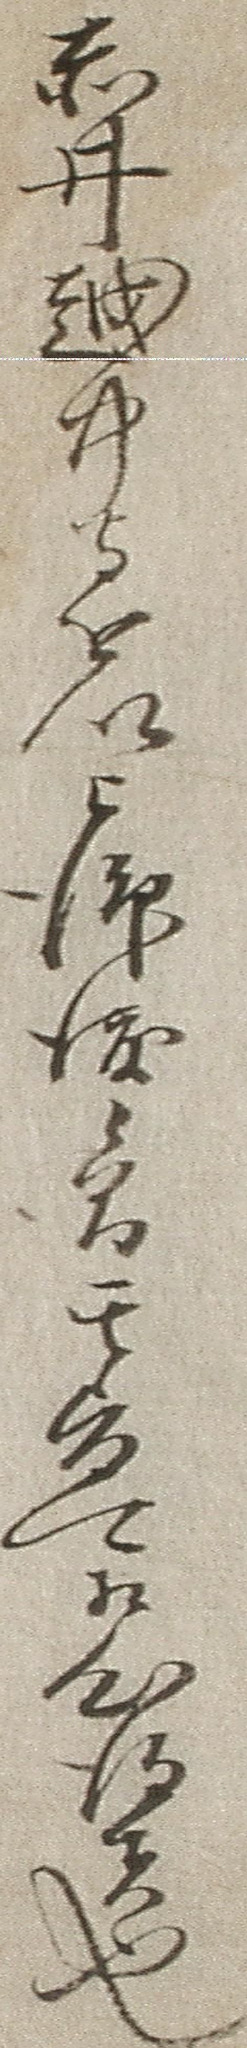赤井越中守を以て被仰渡候間其旨可相心得者也
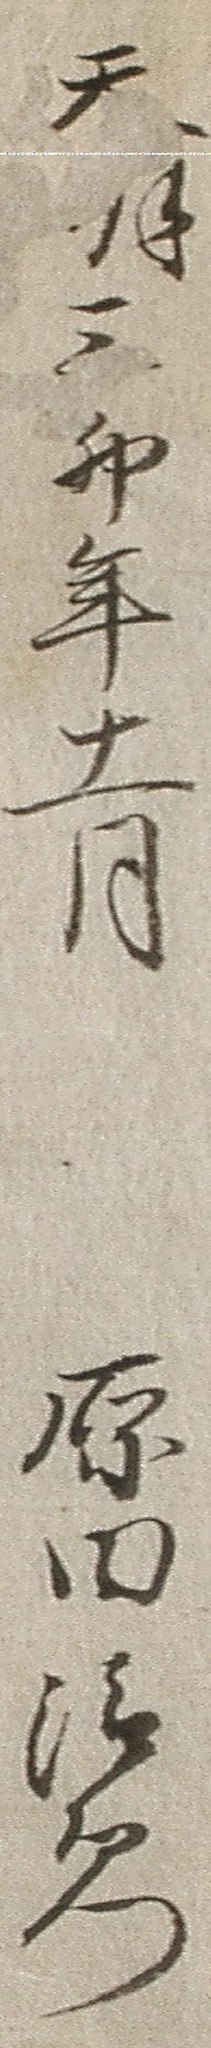天明三卯年十一月原田清右衛門
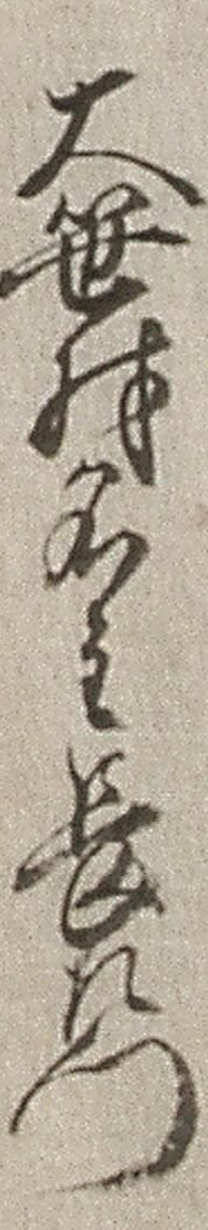大笹村名主長左衛門
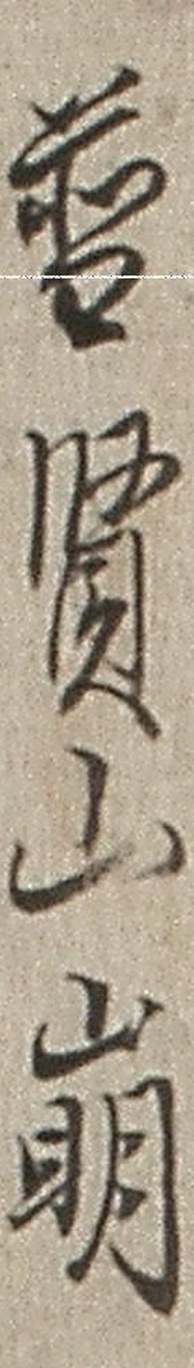普賢山崩
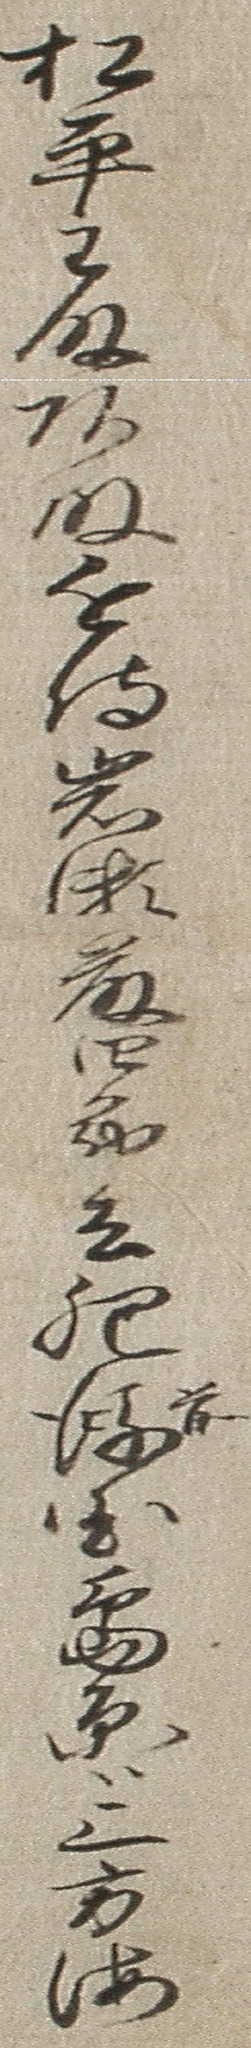松平主殿頭殿近侍岩瀬藤四郎云肥前国島原は三方海
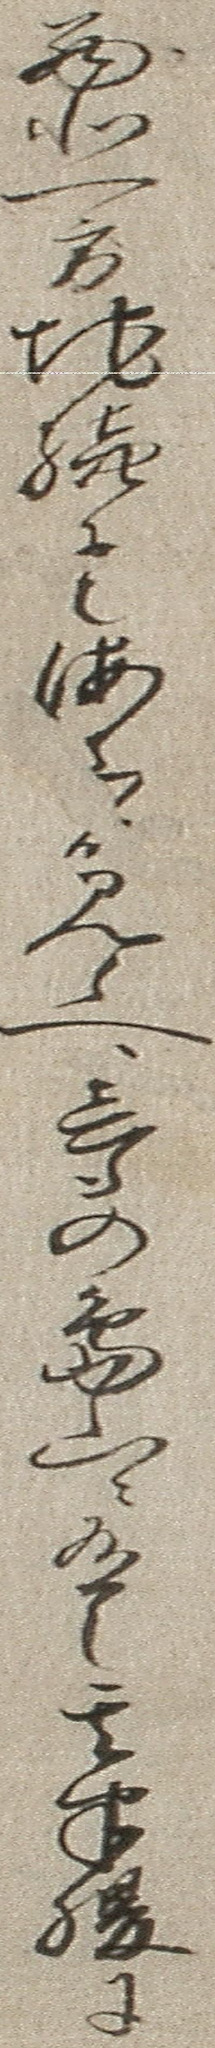西北一方地続にて海上ゟ見候へは壱ツの島山に有之候其の半腹に
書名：太平秘録抜書　浅間山燒及普賢山崩
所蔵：東京大学地震研究所図書室 Earthquake Research Institute Library, The University of Tokyo, JAPAN
